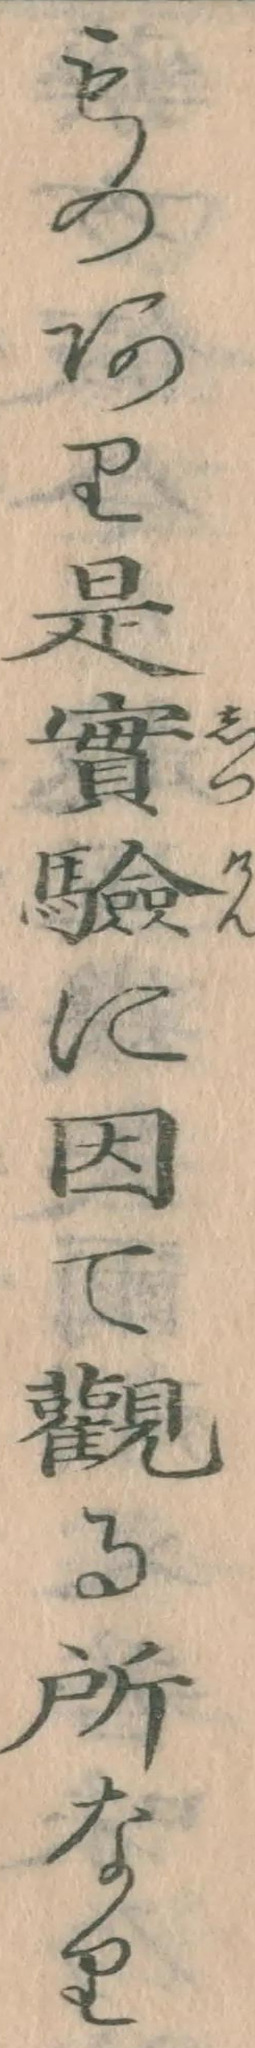ものあり是実験に因て観る所なり
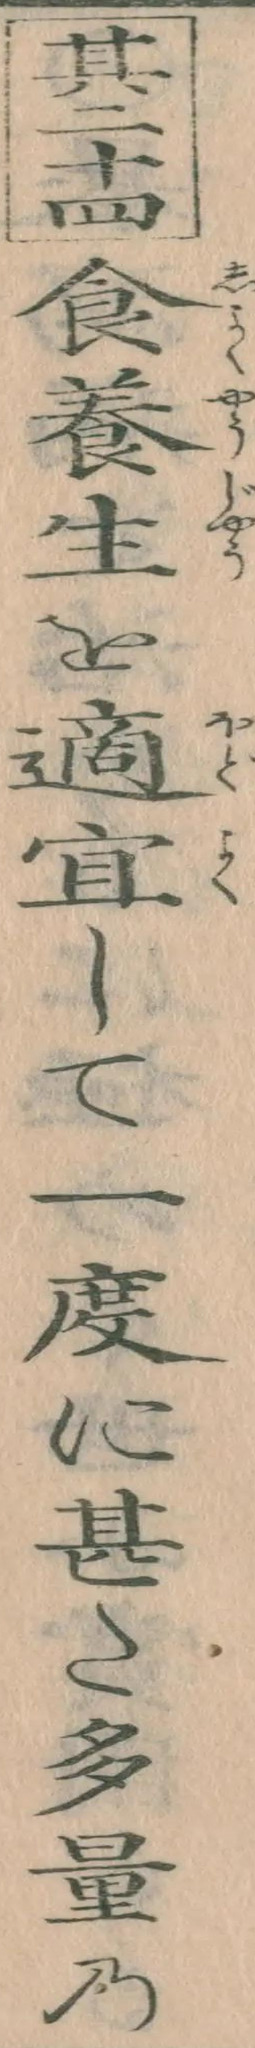其二十四食養生を適宜し一度に甚た多量の
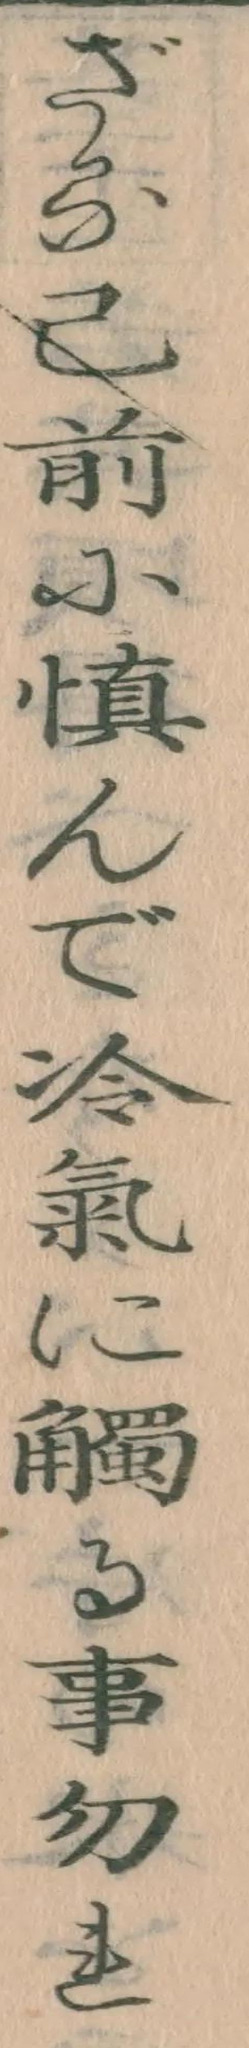ざる已前に慎んで冷気に触る事勿れ
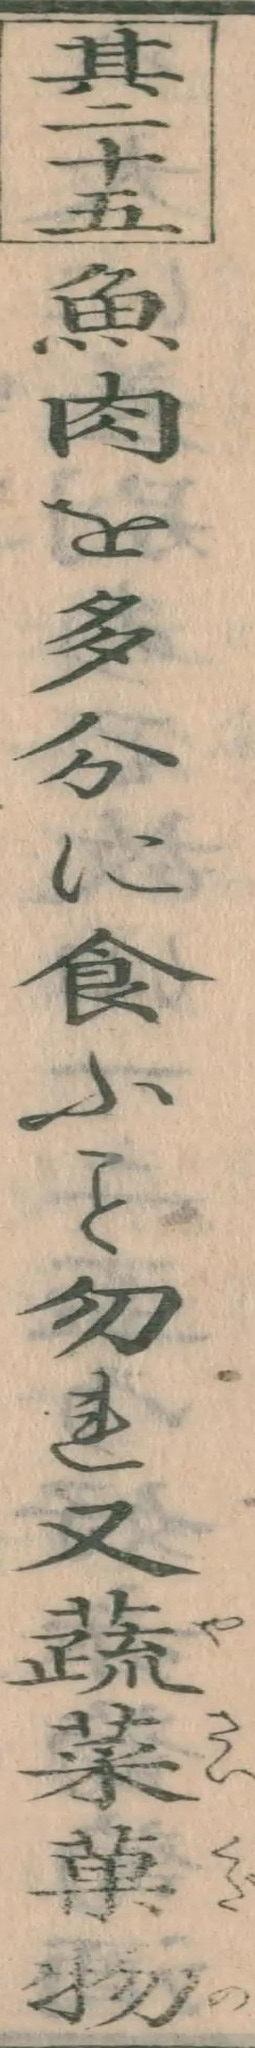其二十五魚肉を多分に食ふこと勿れ又蔬菜菓物
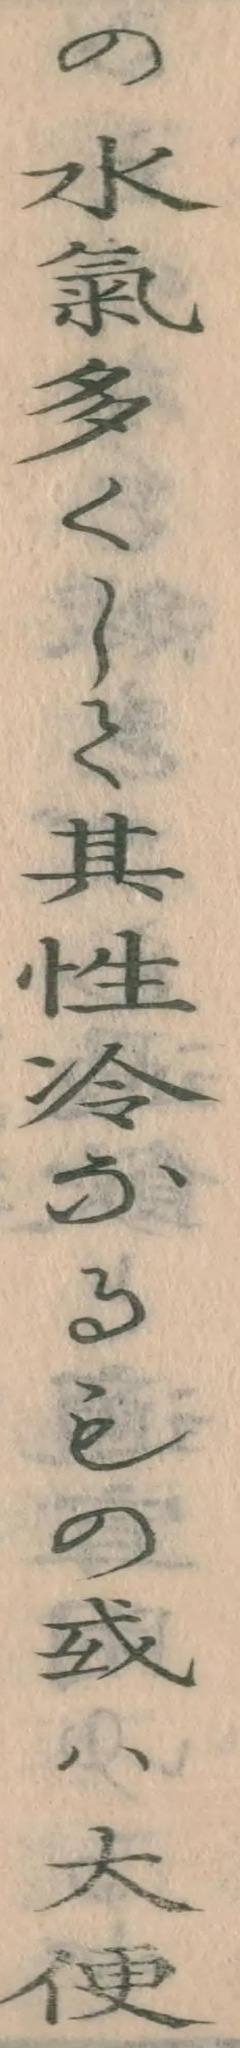の水気多くして其性冷なるもの或は大便
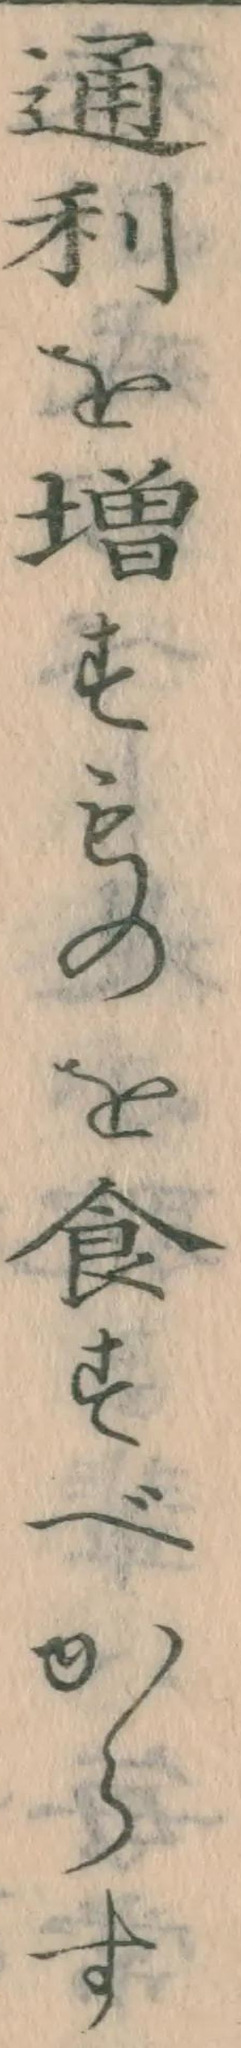通利を増すものを食すべからす
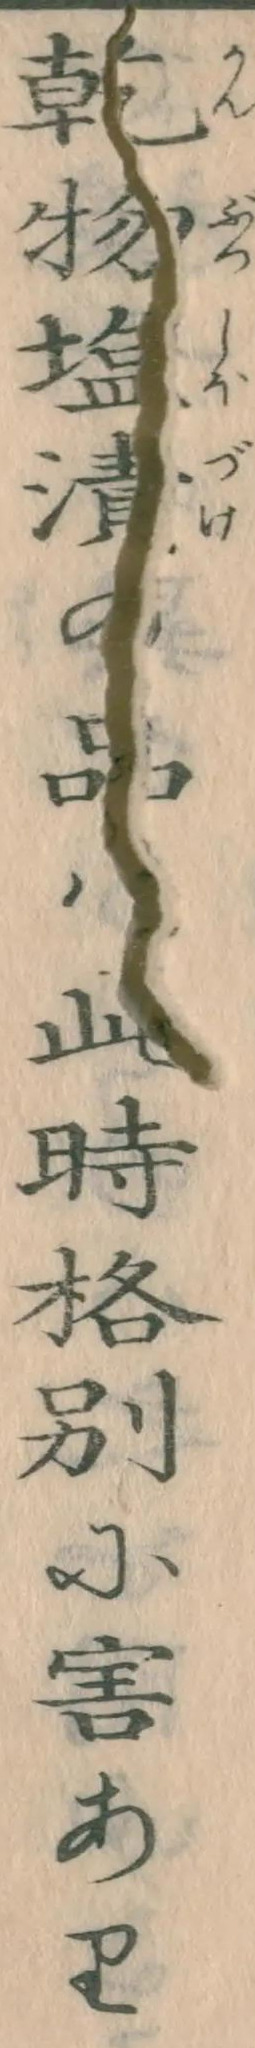乾物塩漬の品は此時格別に害あり
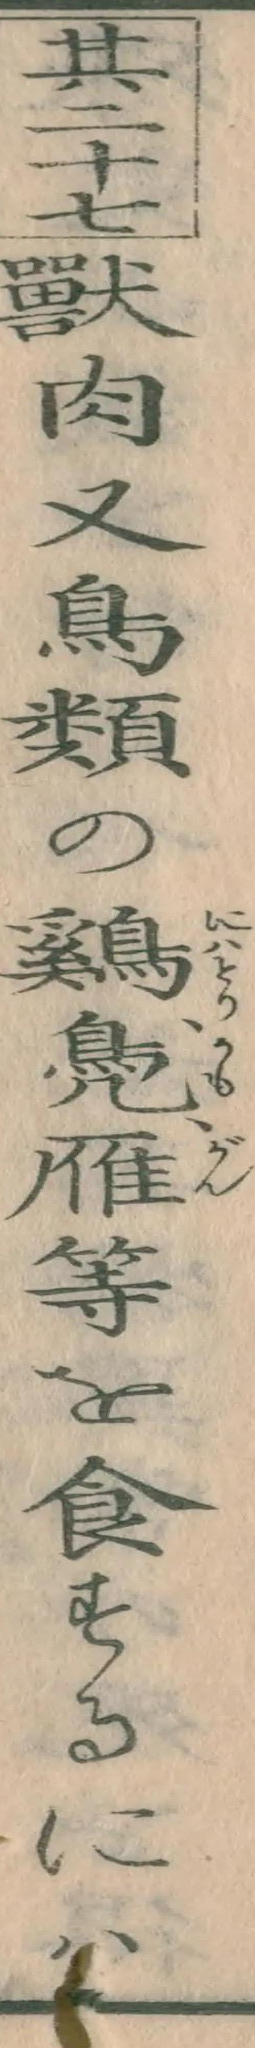其二十七獣肉又鳥類の鷄、鳧、雁等を食するには

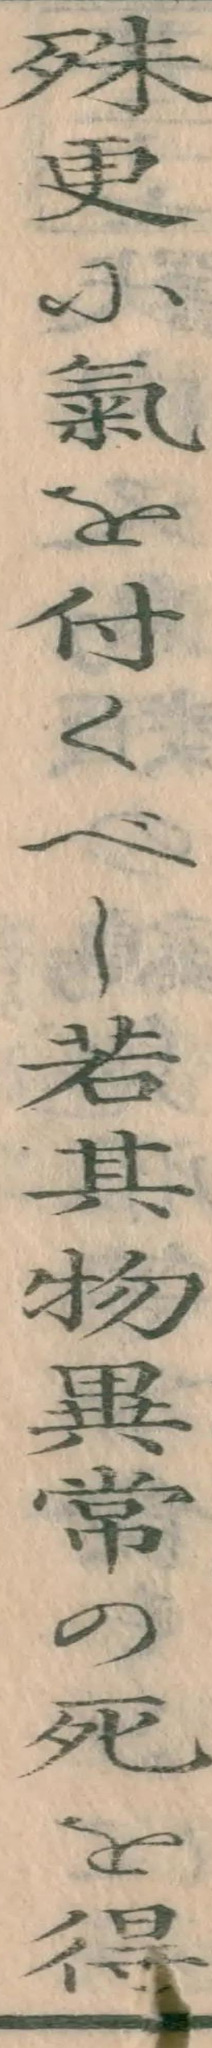殊更に気を付くべし若其物異常の死を得
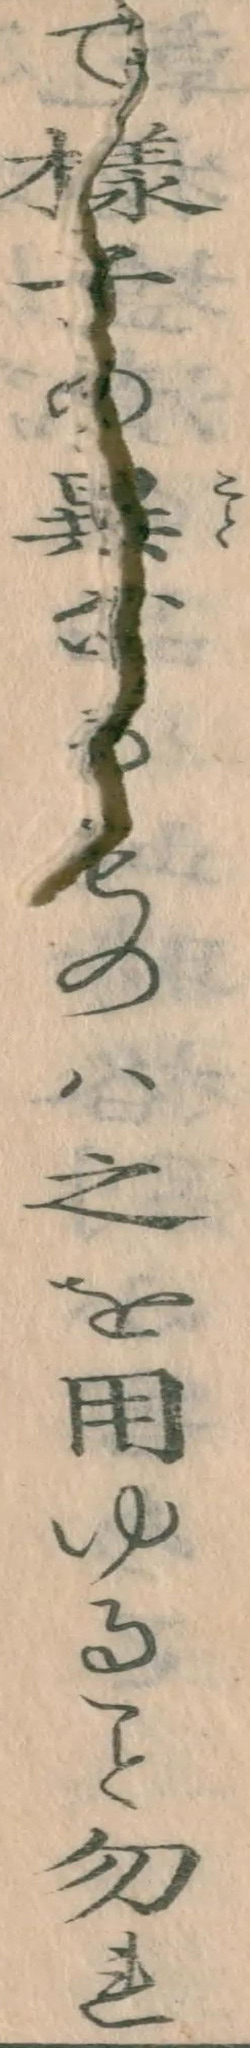て様子の異なるものは之を用ゆること勿れ
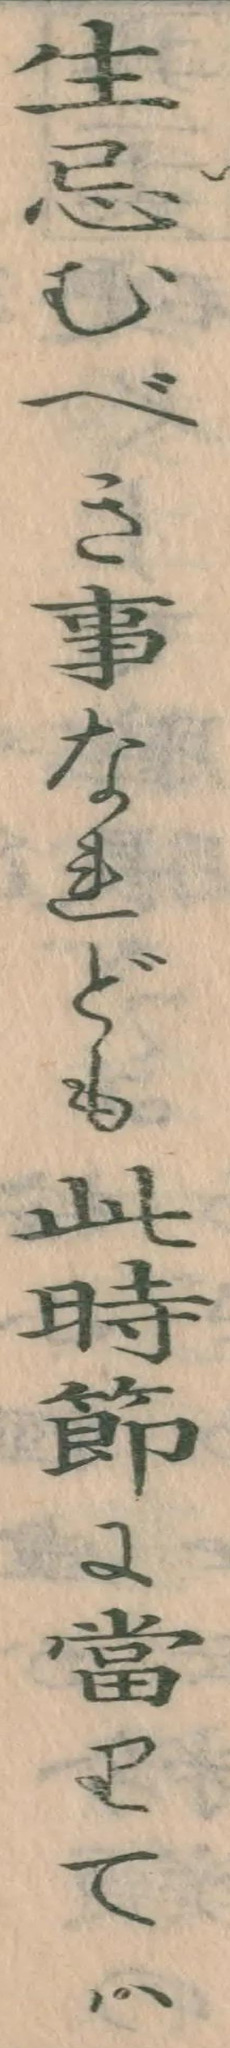生忌むべき事なれども此時節に当りては
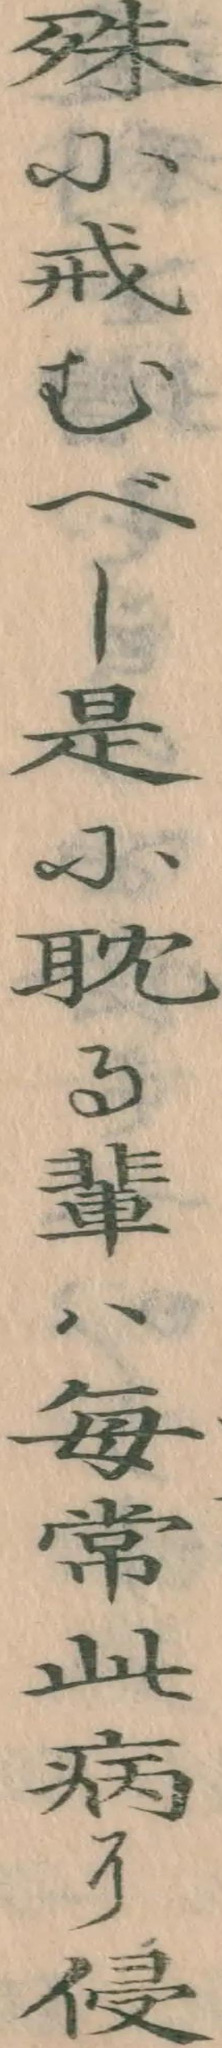殊に戒むべし是に耽る輩は毎常病に侵
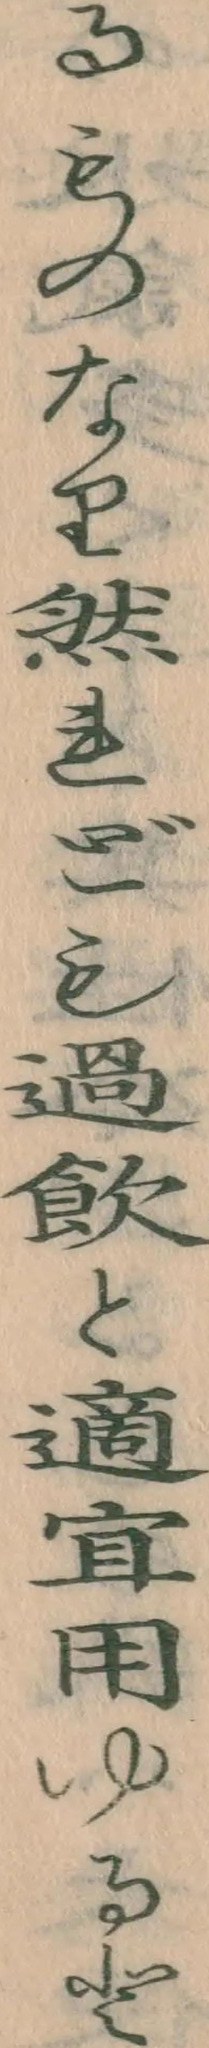るものなり然れども過飲と適宜用ゆると
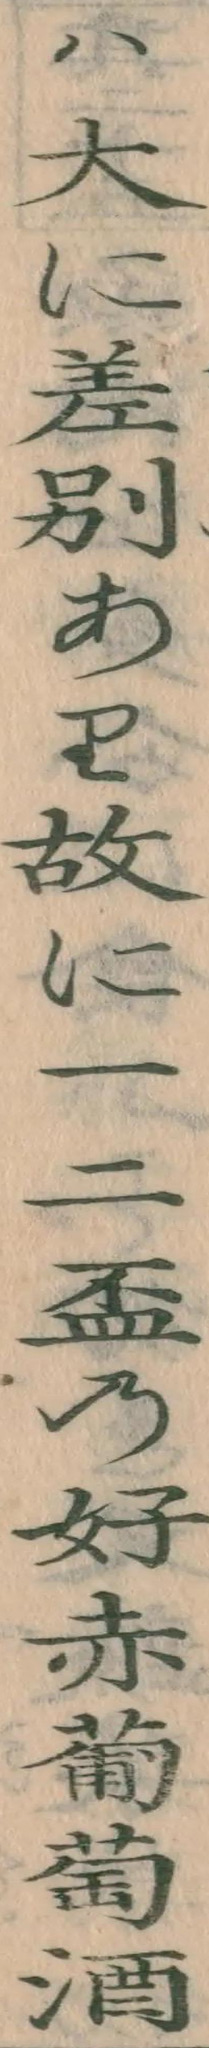は大に差別あり故に一二盃の好赤葡萄酒
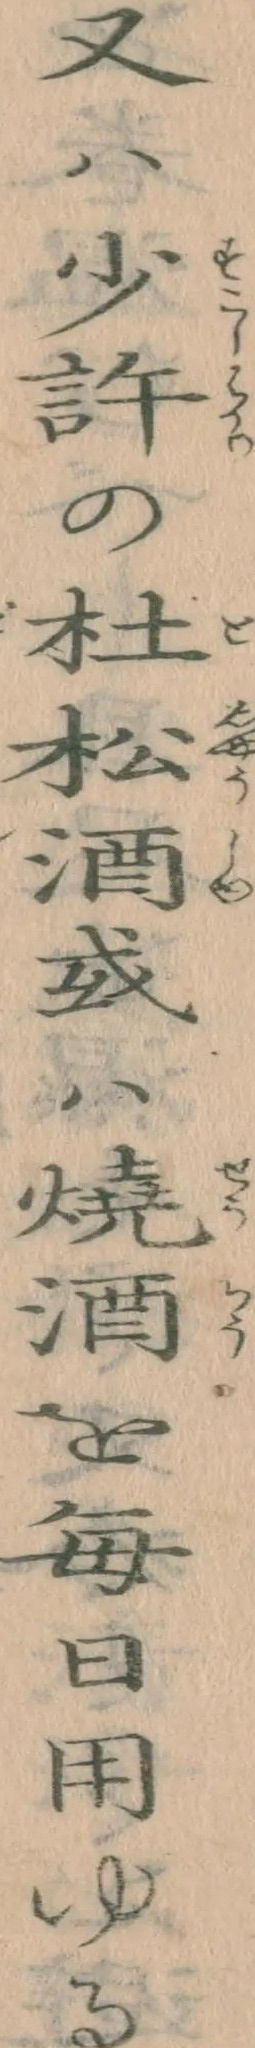又は少許の杜松酒或は焼酒を毎日用ゆる
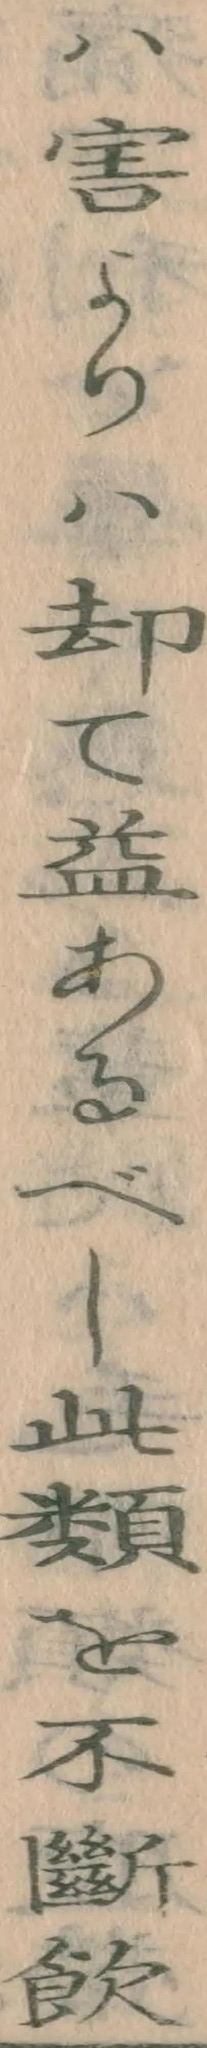は害よりは却て益あるべし此類を不断飲
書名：暴瀉病手当素人心得書
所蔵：国立国会図書館 National Diet Library, JAPAN
